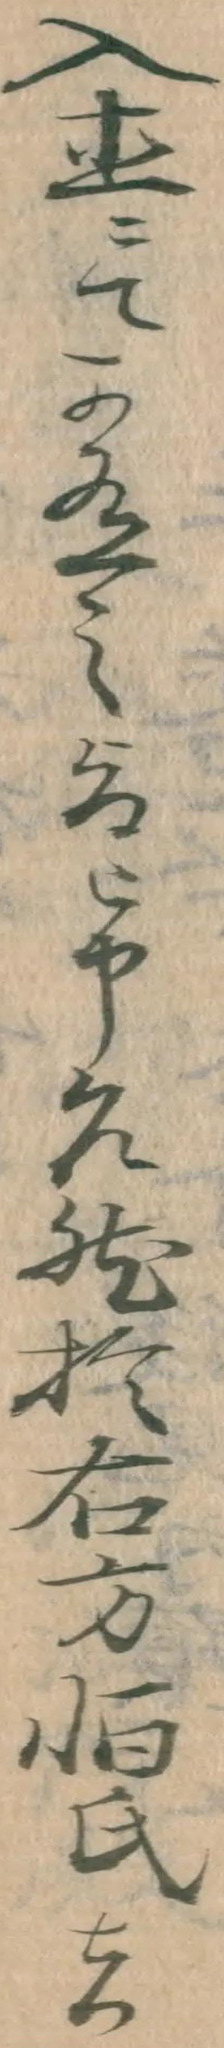入直ニて可有之旨被申乍然於右方恒氏者
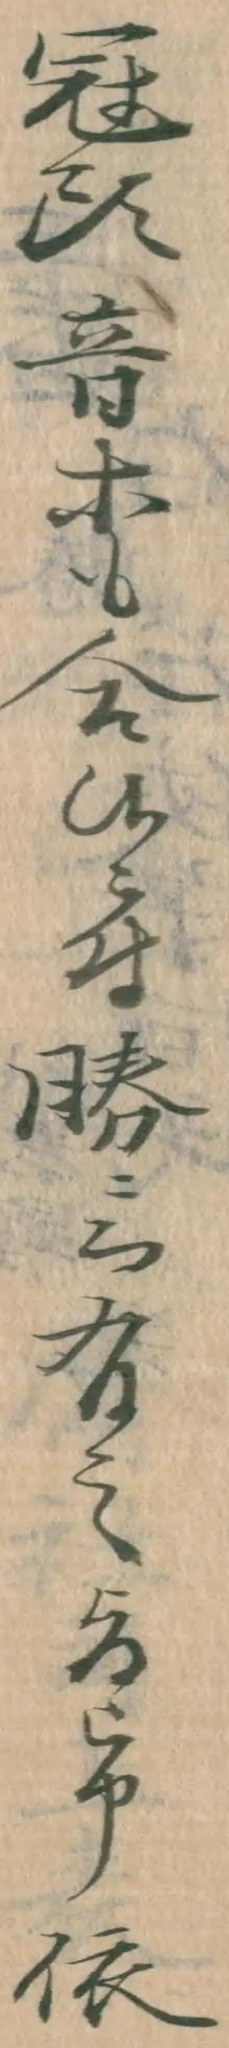冠頭音等も合候ニ付勝ニ而有之旨被申依
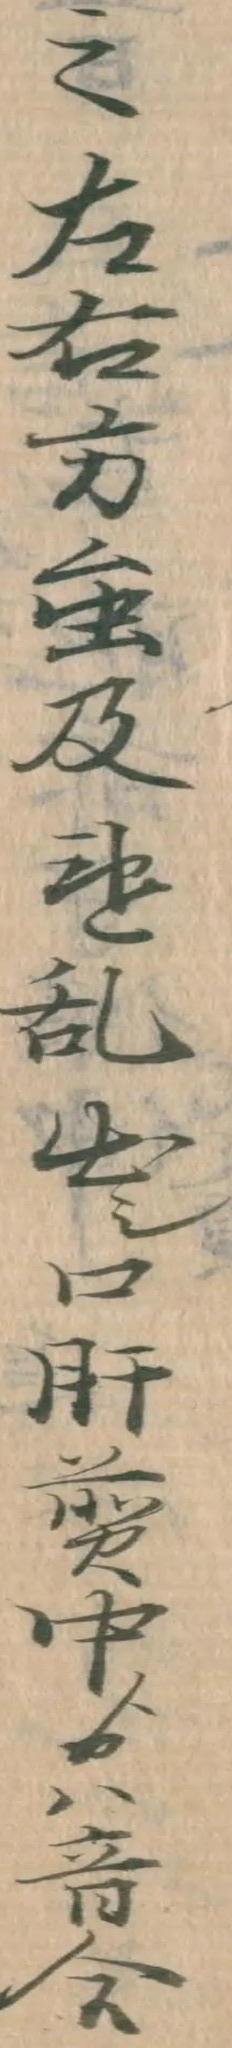之左右方雖及違乱出シ口肝煎中ゟハ音合
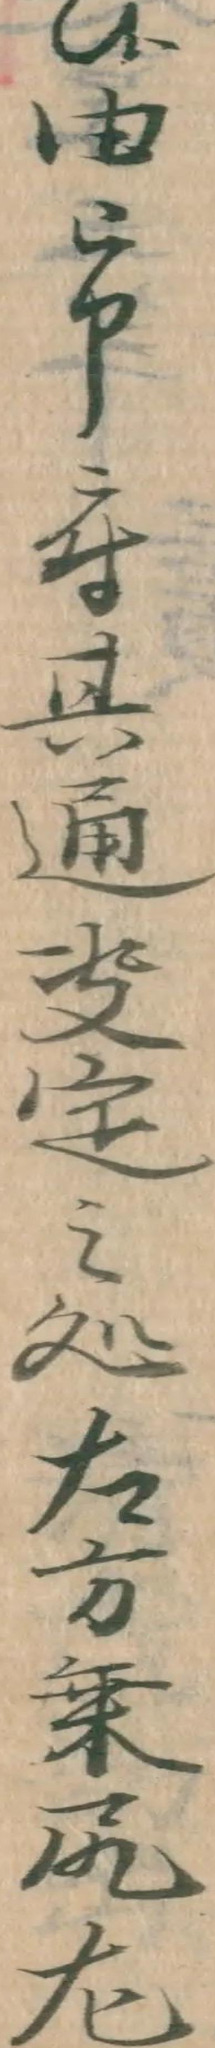候由被申ニ付其通決定之処右方乗尻左
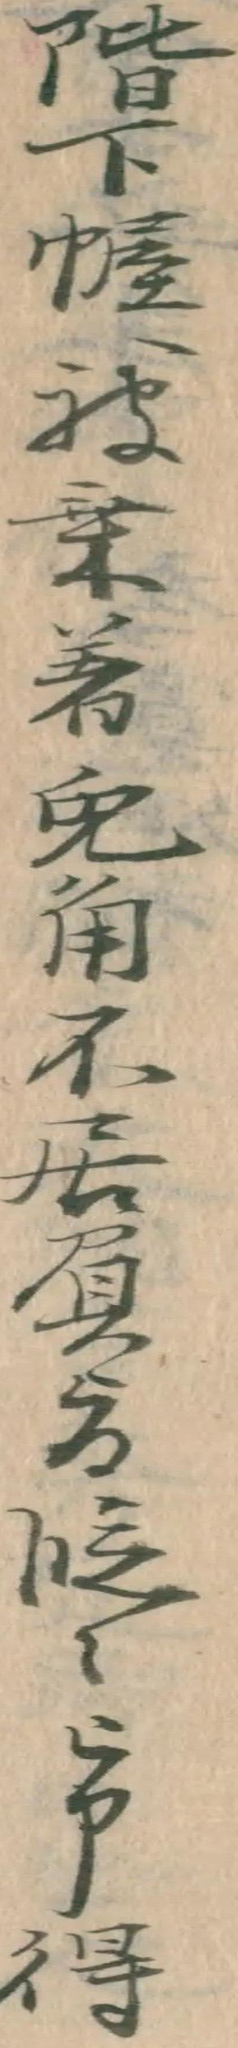階下幄へ被乗着兎角不居負旨段々被申得
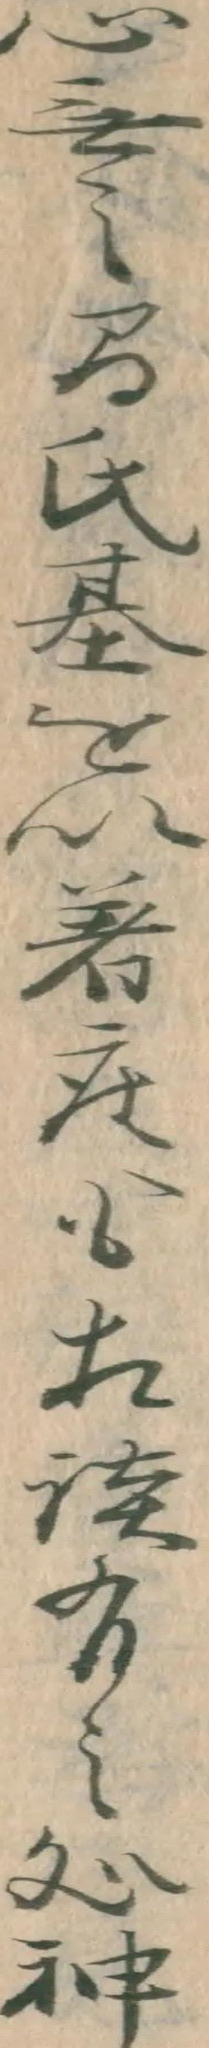心無之間氏基を以着座へも相談有之処神
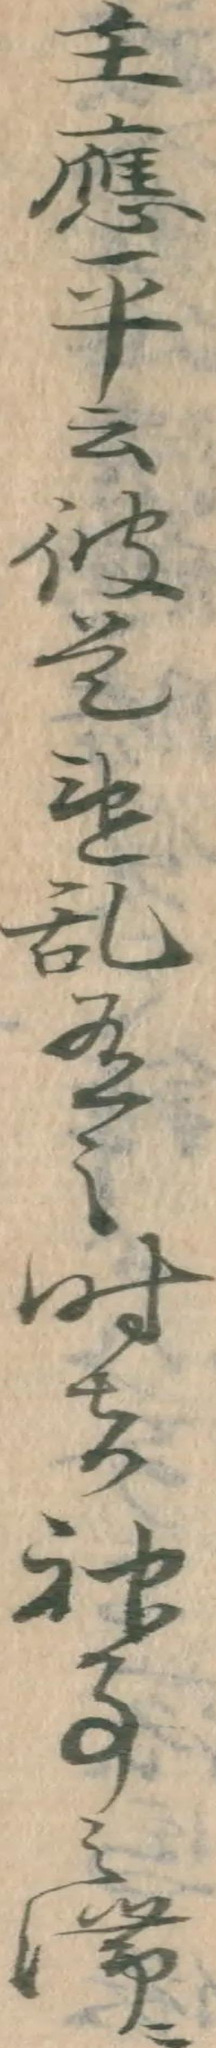主応平云彼是違乱有之時者神事之滞ニ
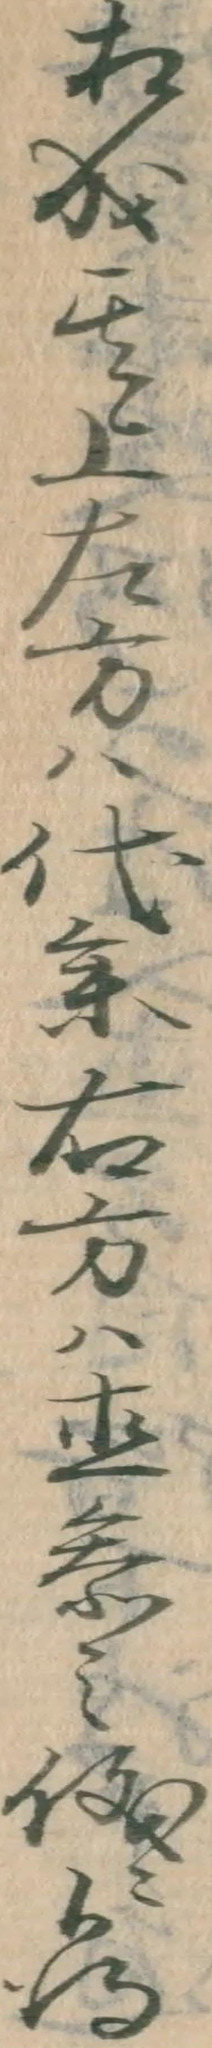相成其上左方ハ代参右方ハ直参之儀ニ候得
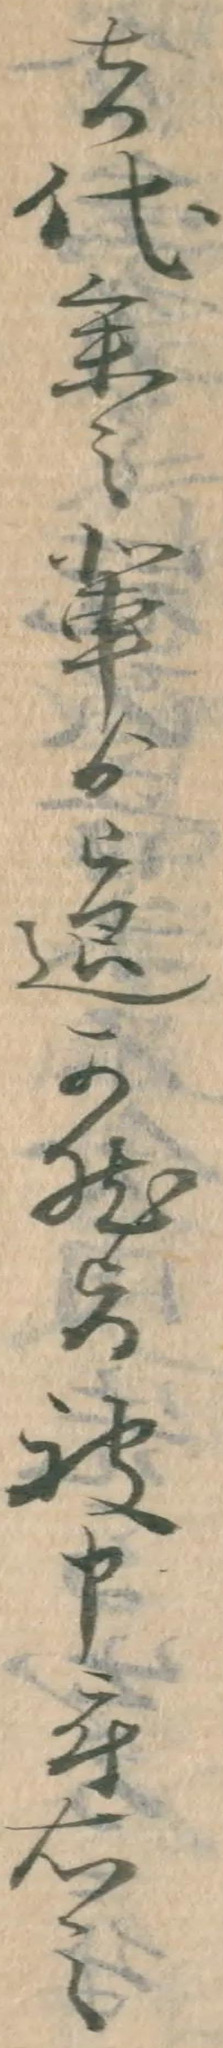者代参之輩ゟ被退可然旨被申ニ付右之
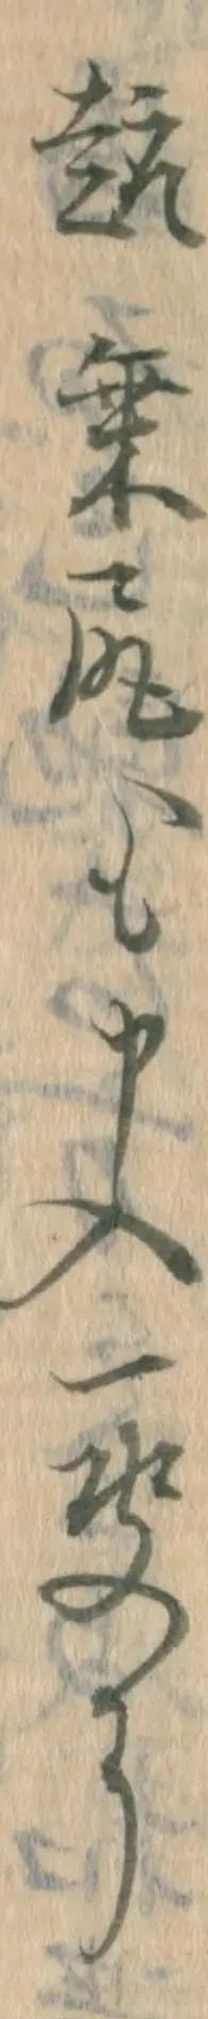趣乗尻へも申入一決了
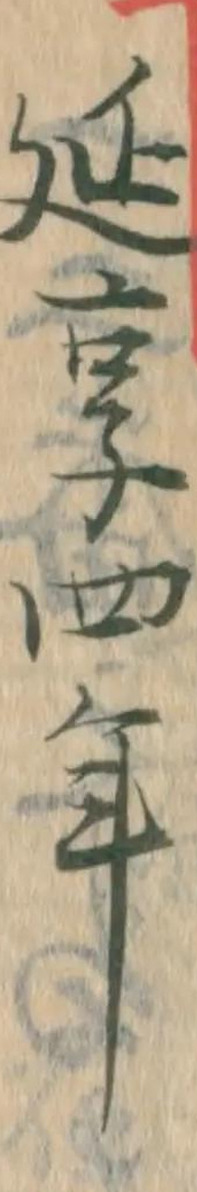延享四年
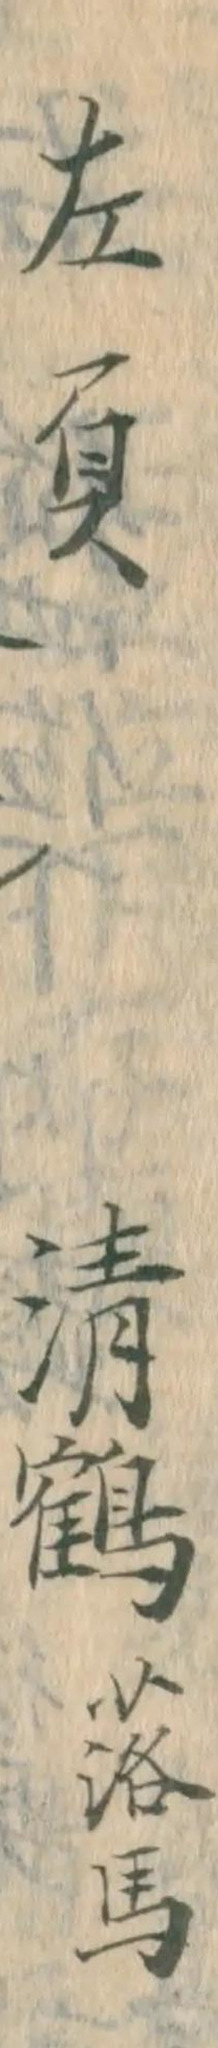左負清鶴落馬
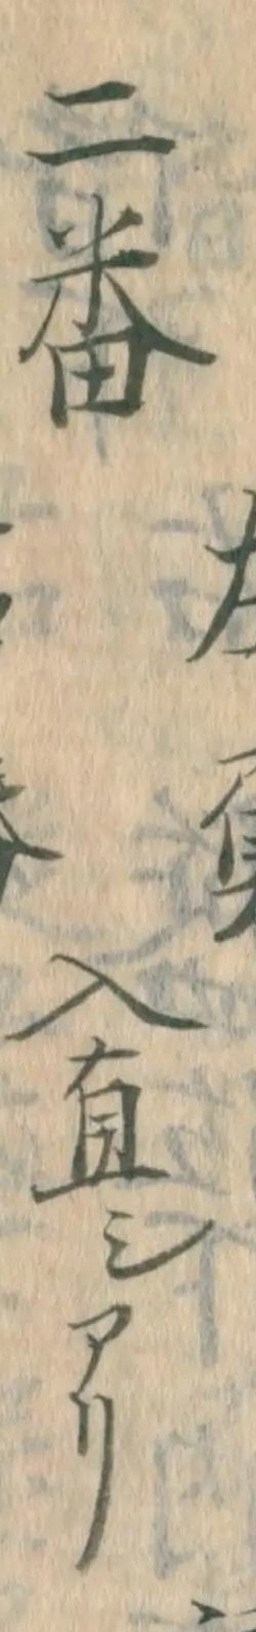入直シアリ

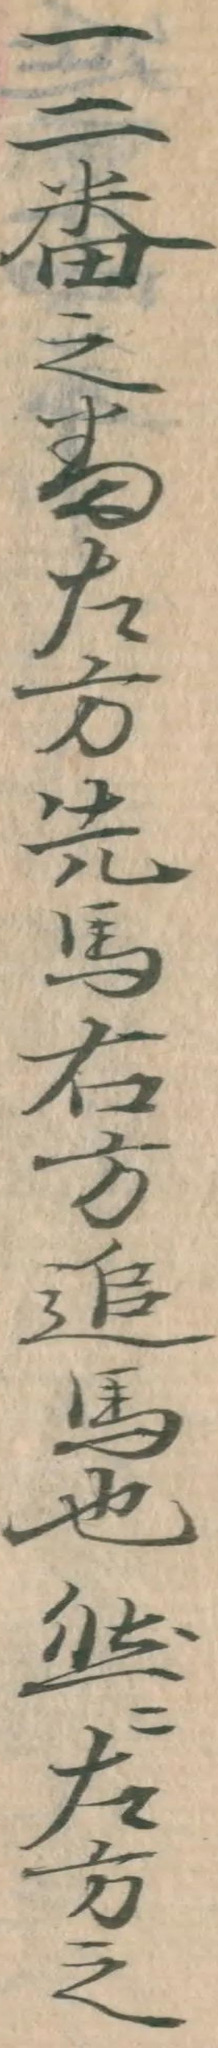一二番之番左方先馬右方追馬也然ニ左方之
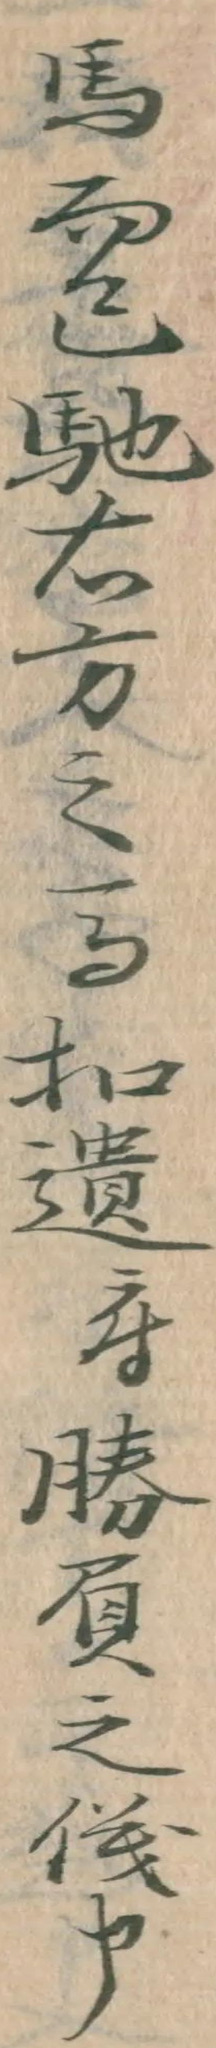馬而已馳右方之馬扣遺ニ付勝負之儀申
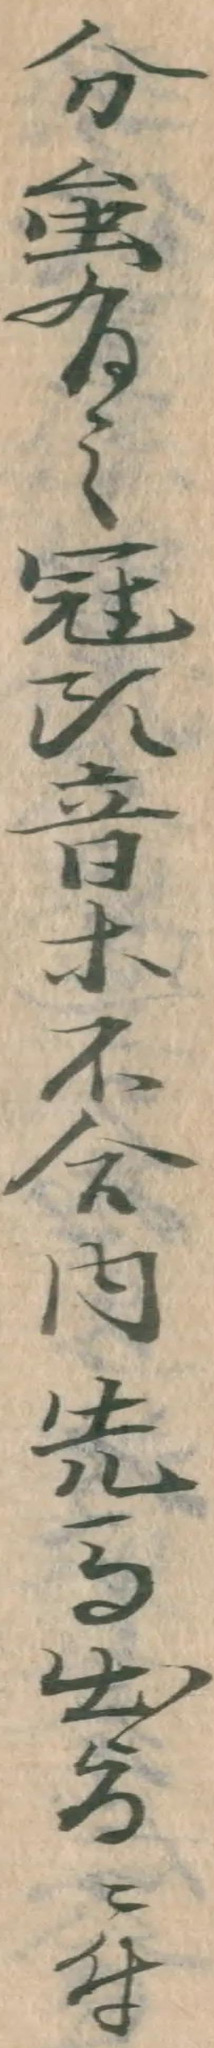分雖有之冠頭音等不合内先馬出旨ニ付
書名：賀茂社記録. 第10冊
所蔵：国立国会図書館 National Diet Library, JAPAN
